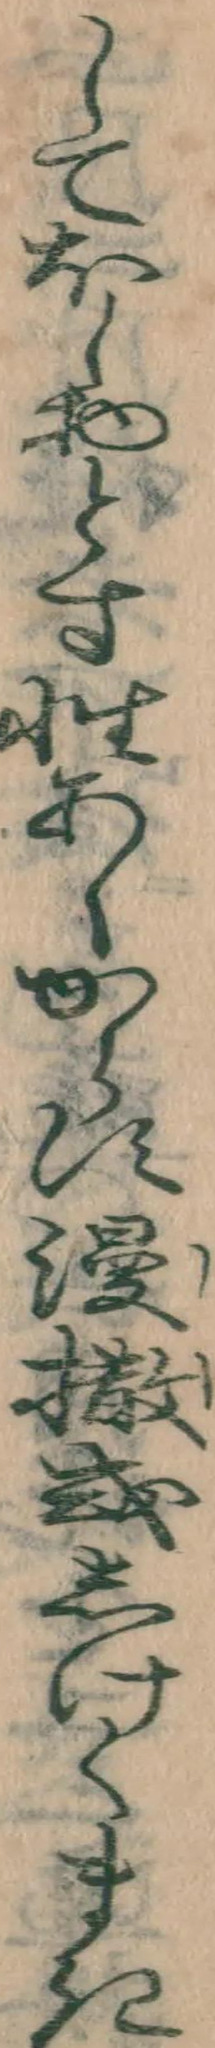してほし物とす性あしからす漫撒或しけくまき
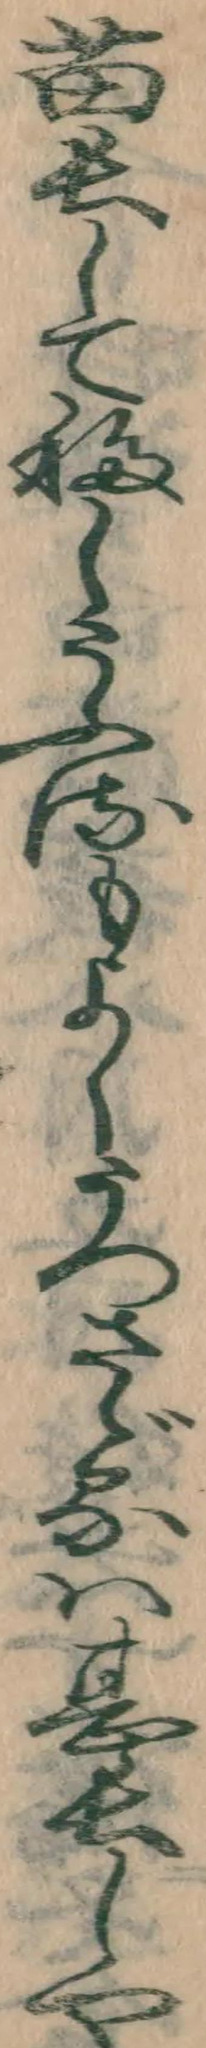苗長して移しうふるもよしうつさゞるは甚長しや
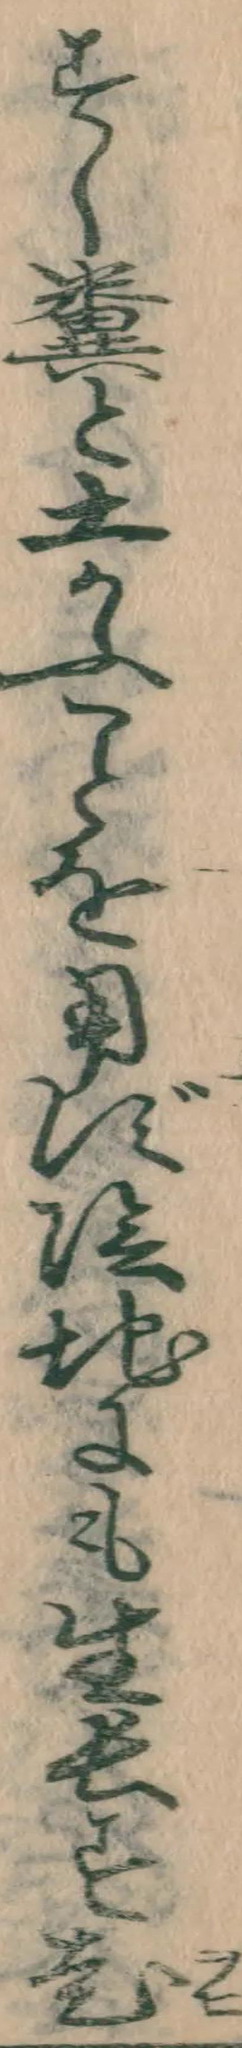すし糞と土うふことを用ず陰地にも生長す老
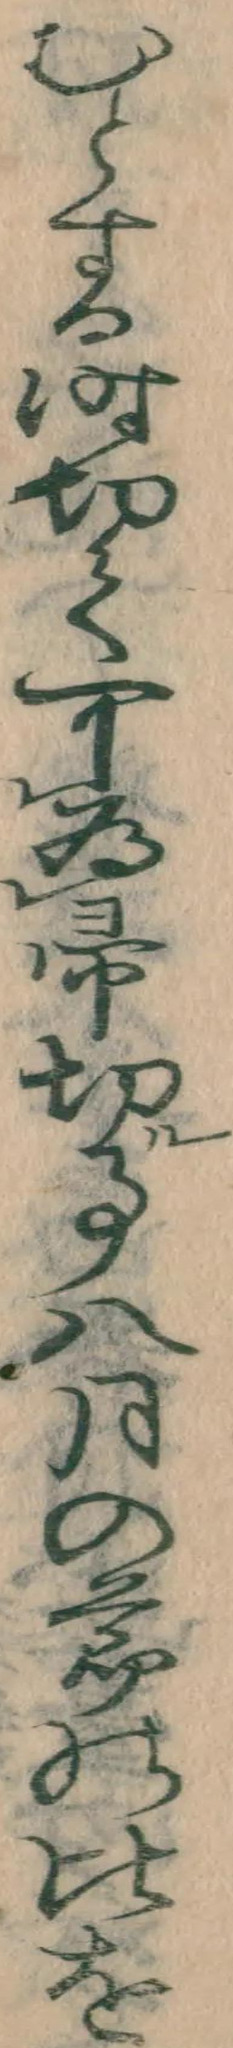むとする時切て可為帚切事八月の節の比を
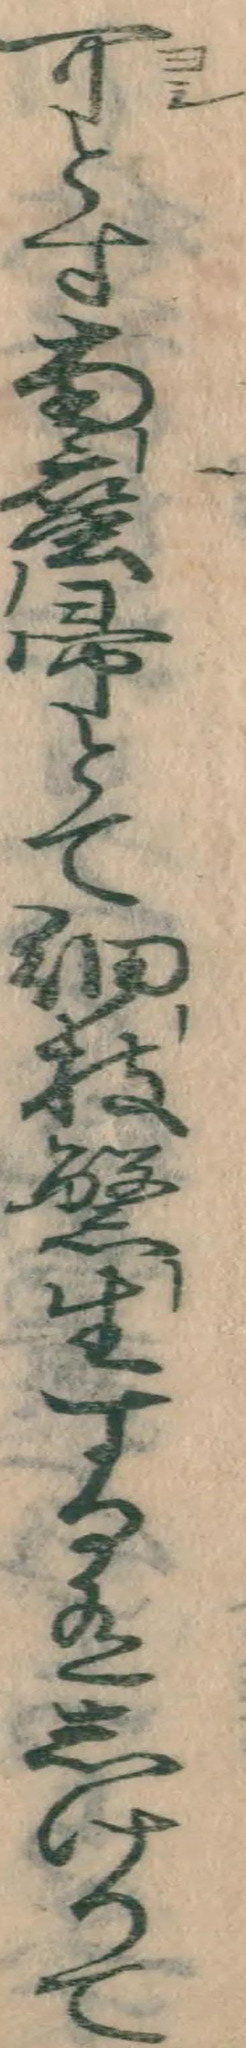可とす南-蛮-帚とて細-枝繁-生する有しけりて
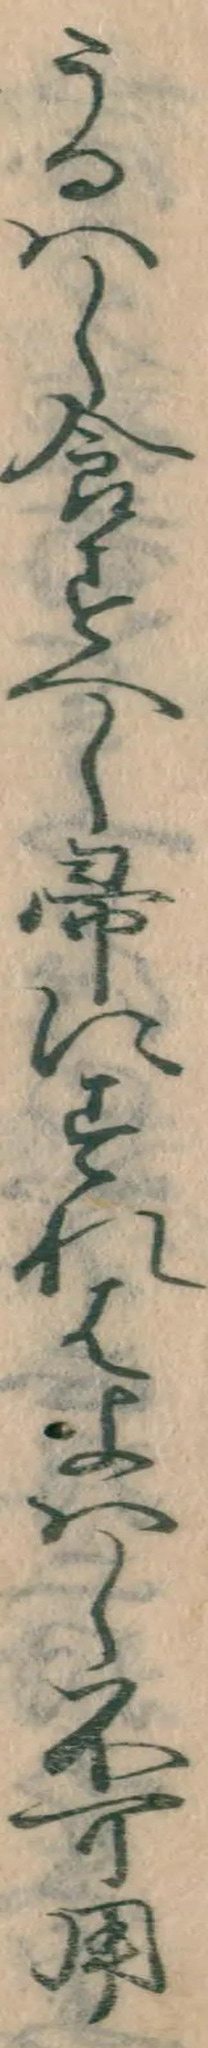うるはし食すへし帚にすれはよはし不可用
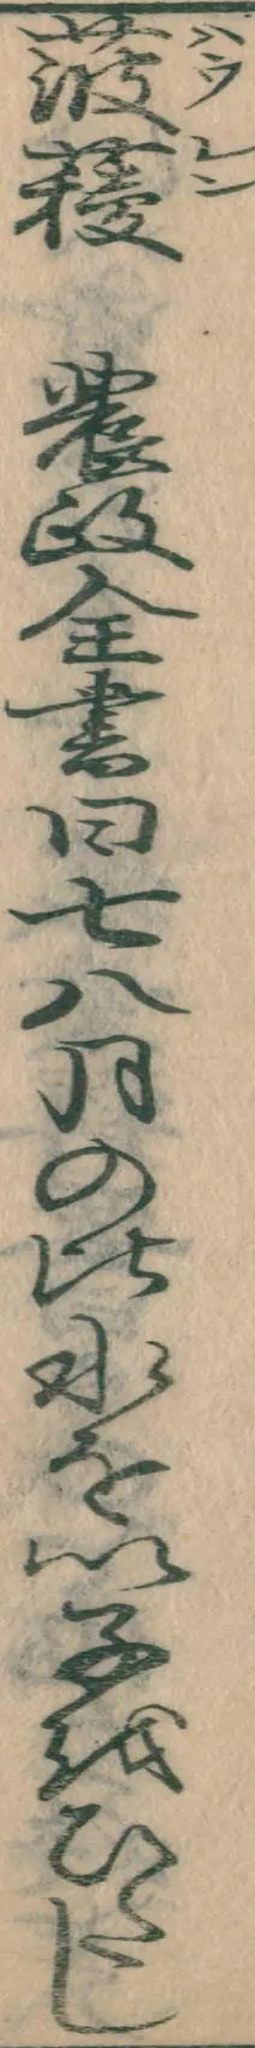菠薐農政全書曰七八月の比水を以子をひたし
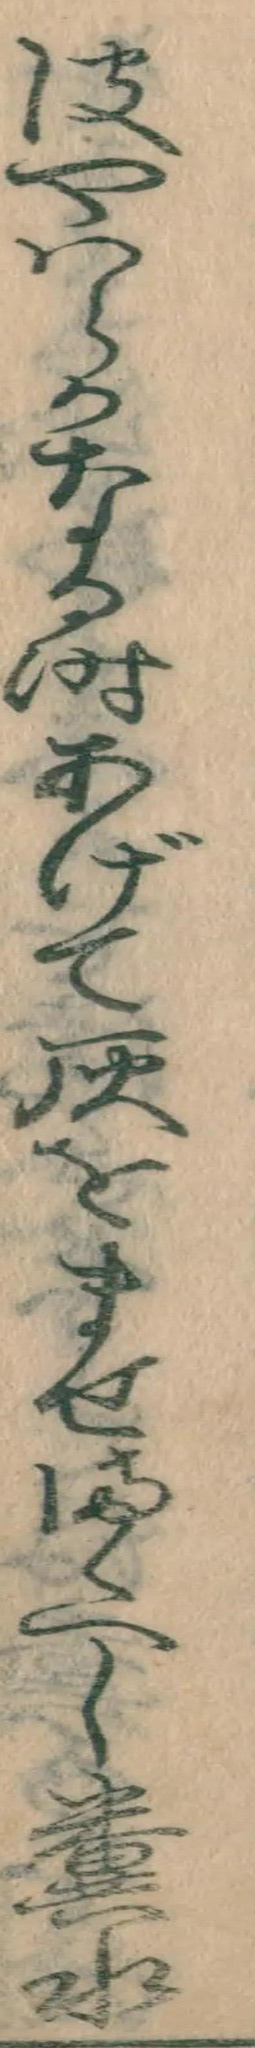皮やはらかなる時あげて灰をませまくへし糞水

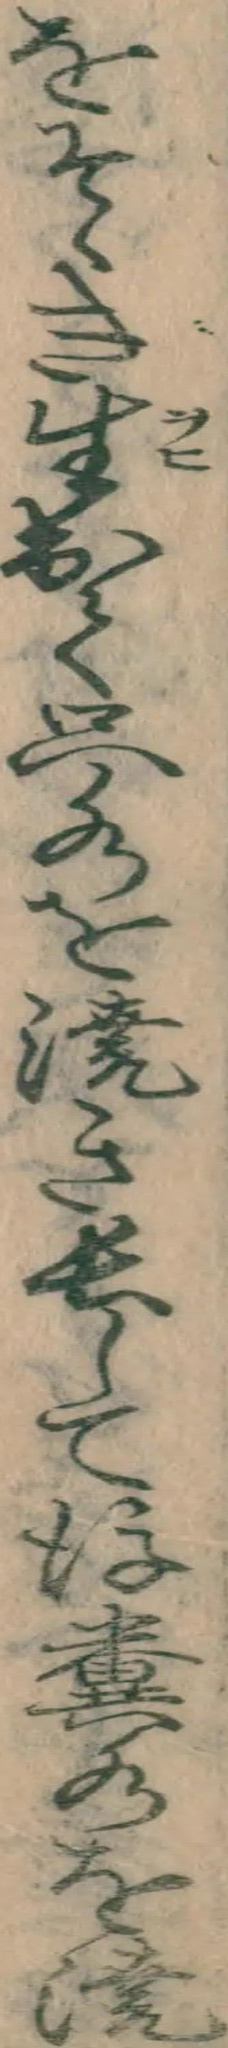をそゝき生出て只水を澆き長して後糞水を澆
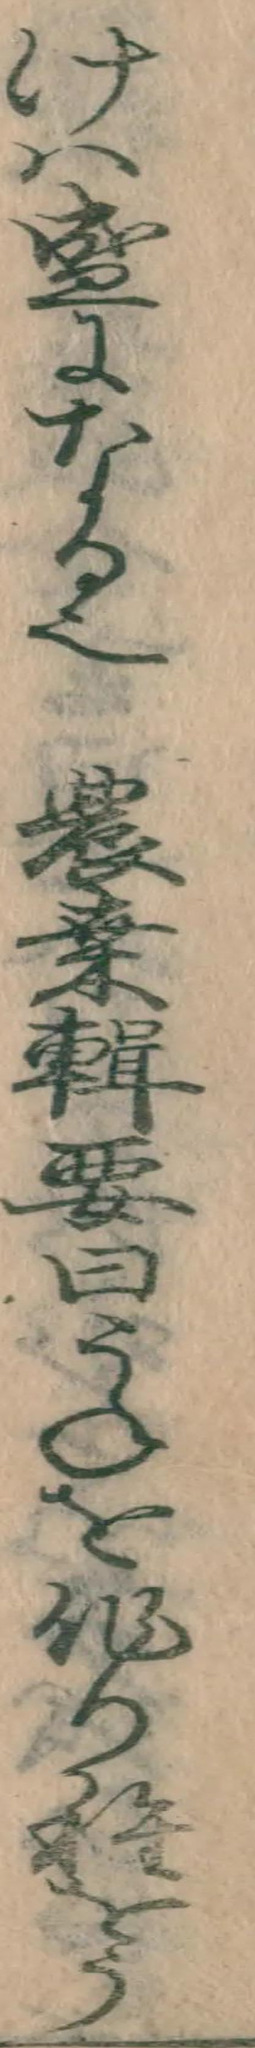けは盛になる也農桑輯要曰うねを作り種をう
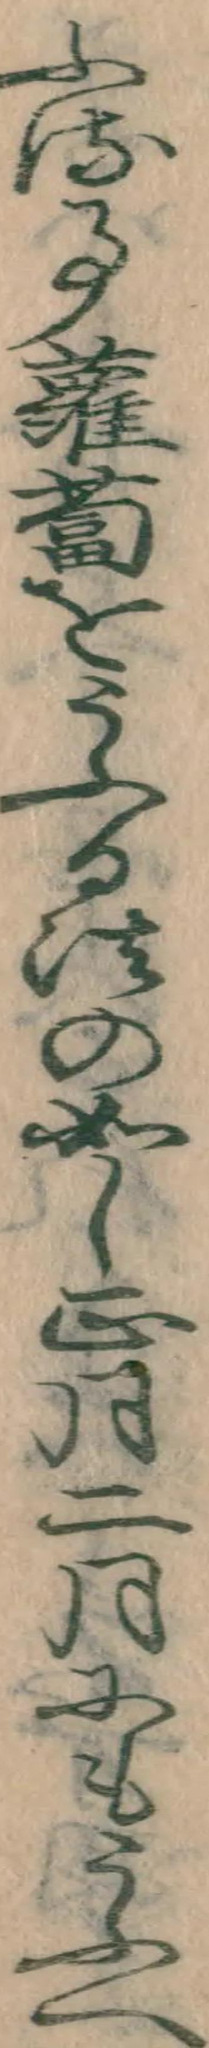ふる事蘿蔔をうふる法の如し正月二月にもうふへ
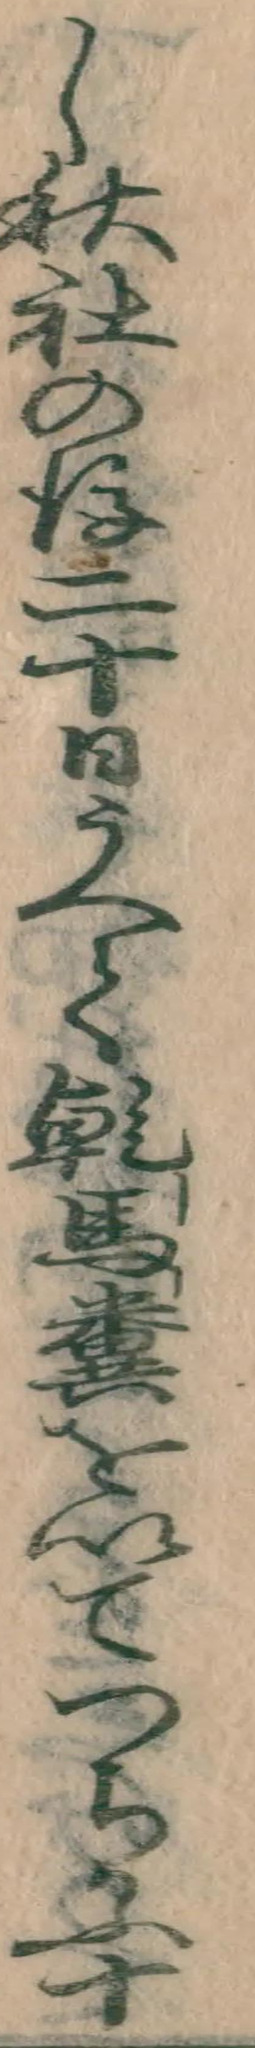し秋社の後二十日うへて乾-馬-糞を以てつちかふ十
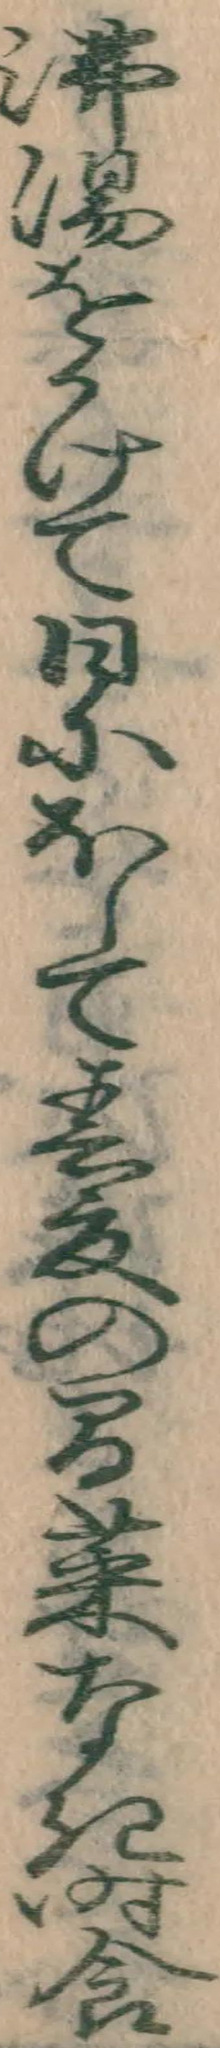沸湯をかけて日にほして春夏の間菜なき時食
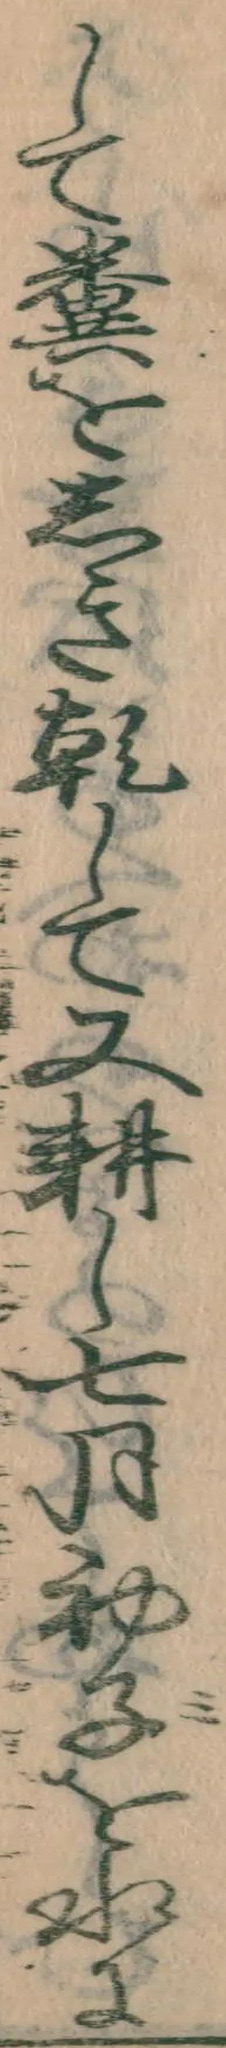して糞をしき乾して又耕し七月初子を水に
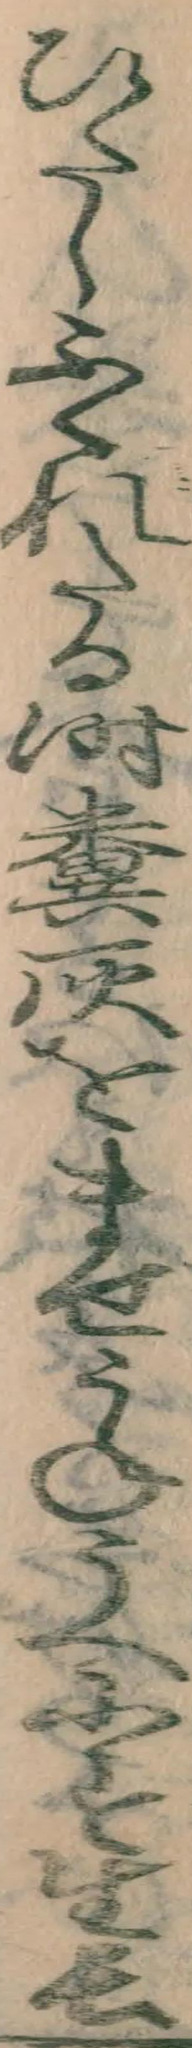ひたしふくれたる時糞灰をまぜうねうへふす生長
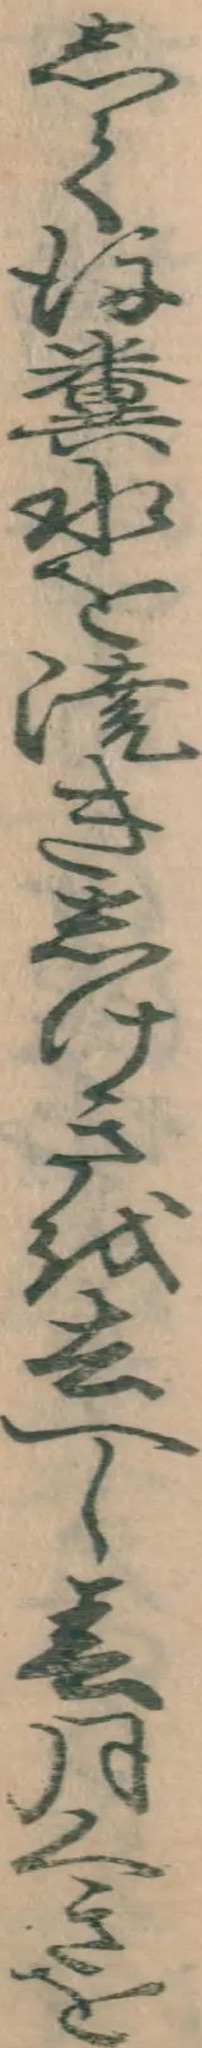して後糞水を澆きしけきを去へし春月くきを
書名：菜譜 3巻
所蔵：国立国会図書館 National Diet Library, JAPAN
